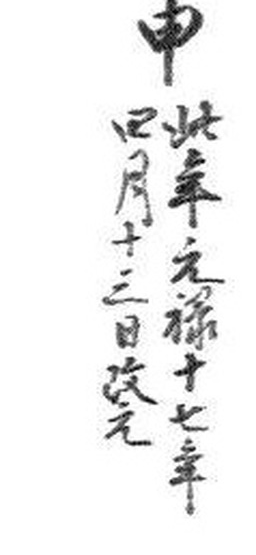四月十三日改元
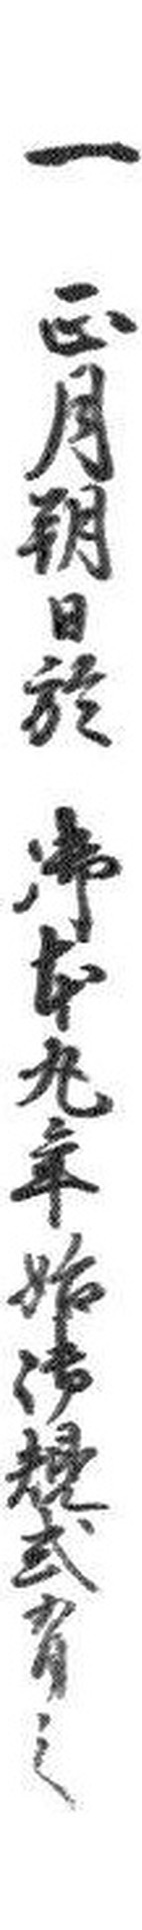一正月朔日於御本丸年始御規式有之
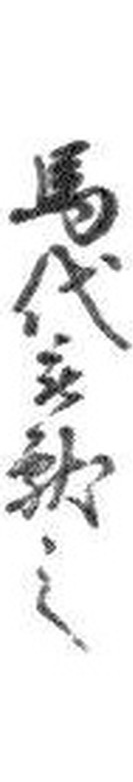馬代被献之
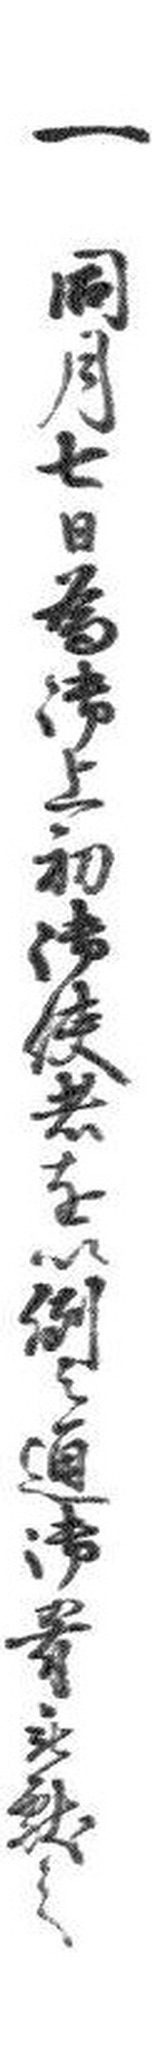一同月七日為御上初御使者を以例之通御肴被献之
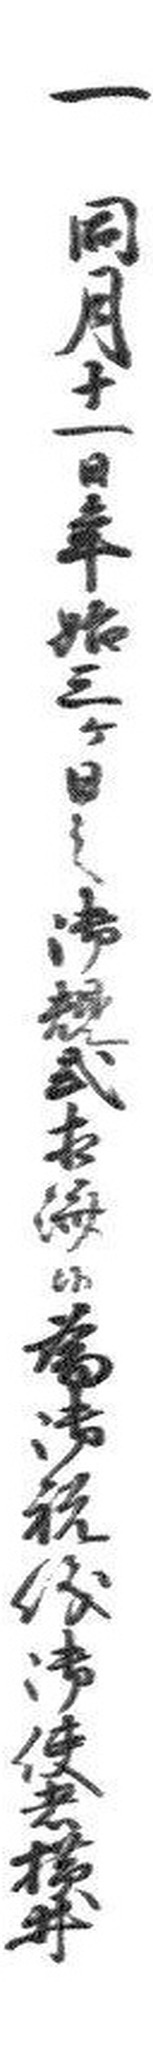一同月十一日年始三ケ日之御規式相済候為御祝儀御使者横井
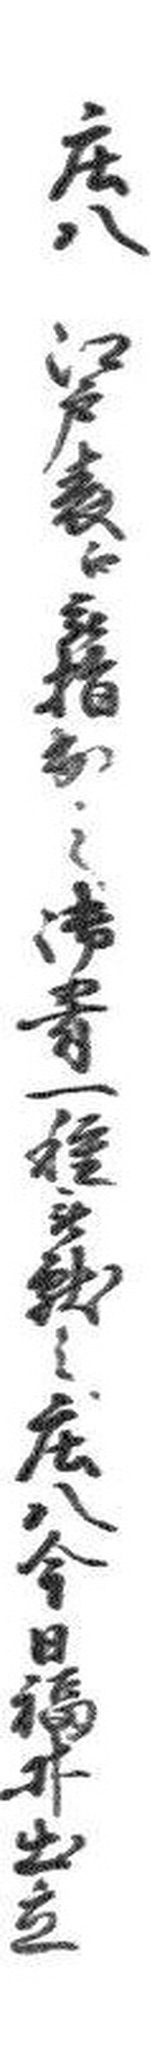庄八江戸表江被指出之御肴一種被献之庄八今日福井出立

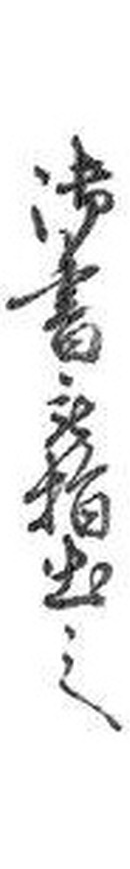御書被指出之
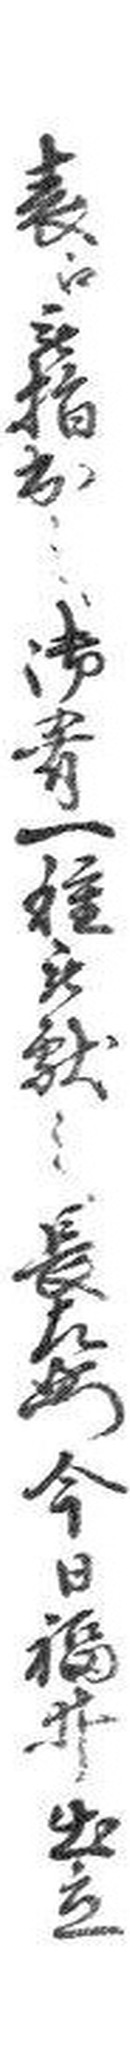表江被指出之御肴一種被献之長左衛門今日福井出立
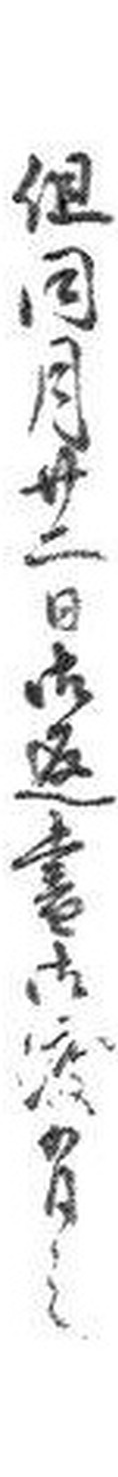但同月廿二日御返書御渡有之
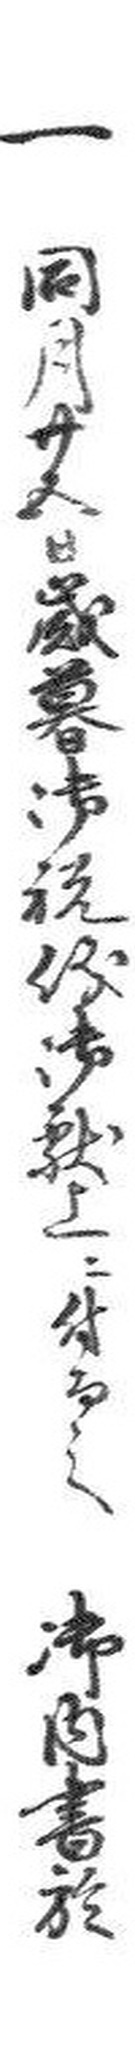一同月廿五日歳暮御祝儀御献上ニ付而之御内書於
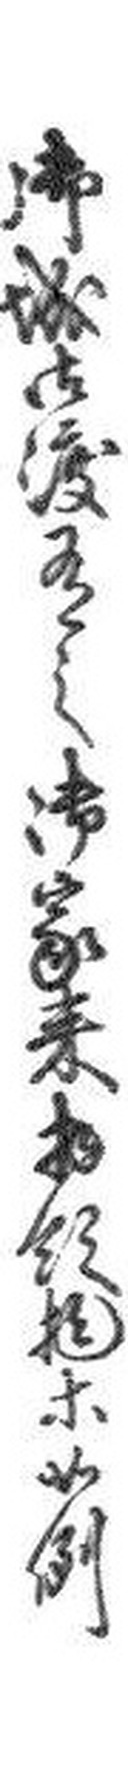御城御渡有之御家来拝領物等如例
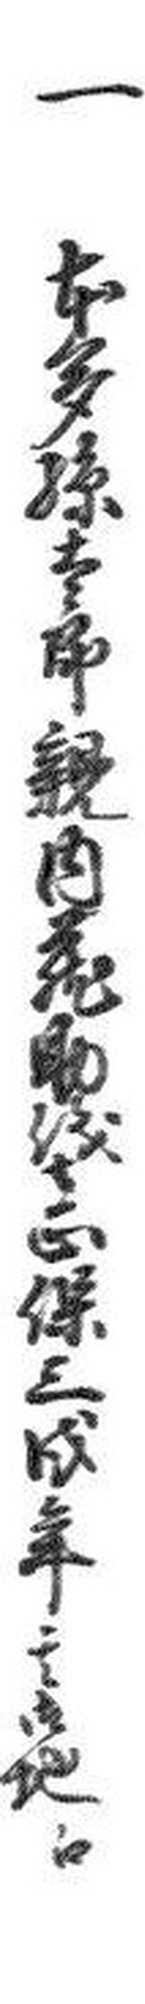一本多孫太郎親内蔵助儀者正保三戌年其御地江
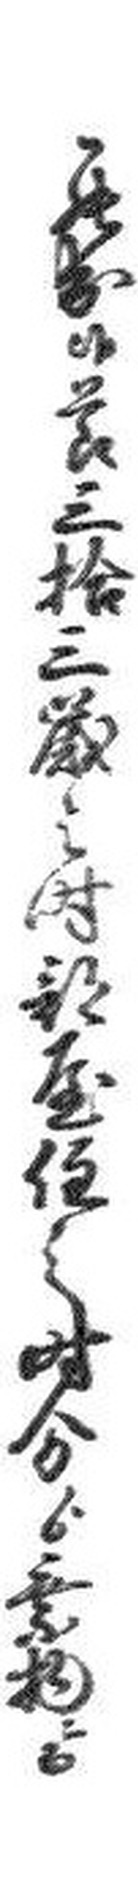罷出候節三拾三歳之時部屋住之時分ゟ乗物ニ而
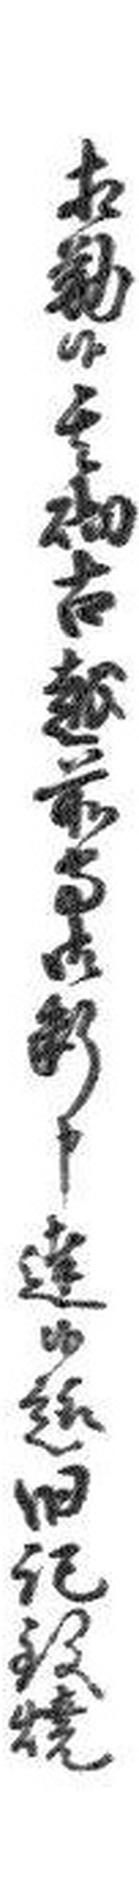相勤候其砌古越前守御断申達候趣旧記致焼
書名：家譜 二十三 吉品公 従宝永元年到同二年
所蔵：福井県文書館 Fukui Prefectural Archives
